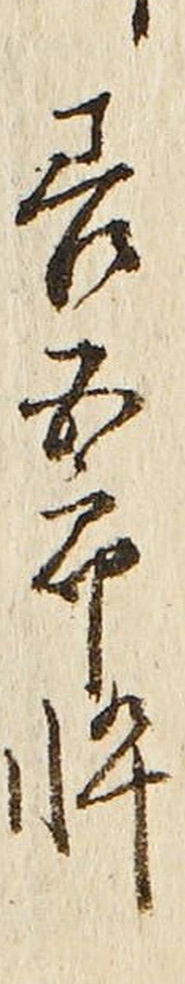善五郎悴
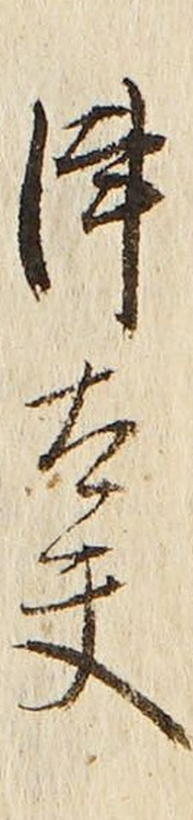津太夫
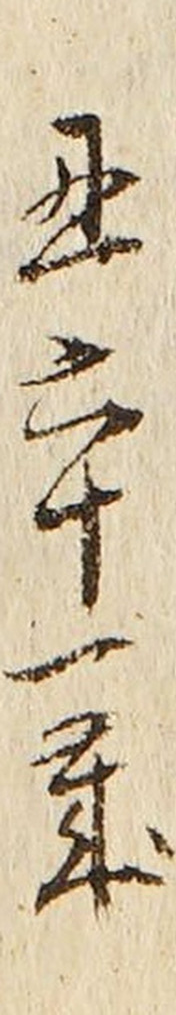丑六十一歳
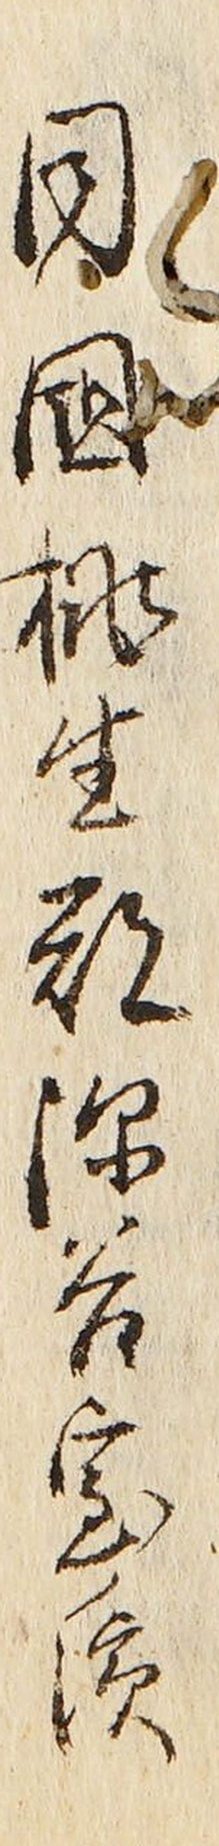同国桃生郡深谷室浜
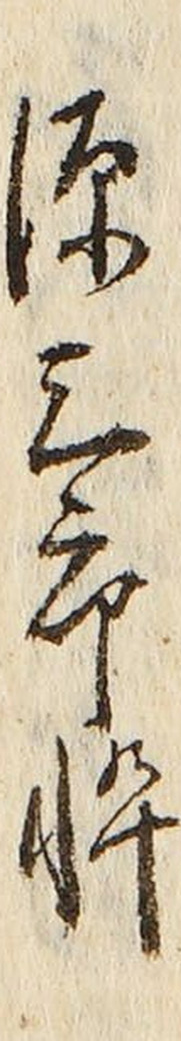源三郎悴
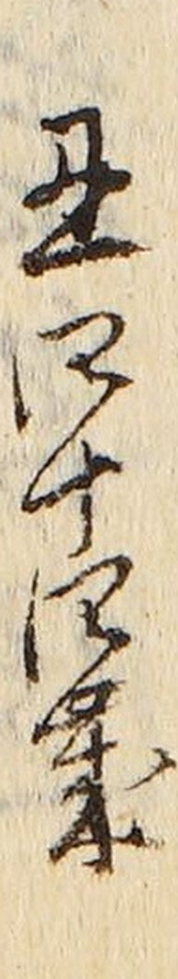丑四十四歳
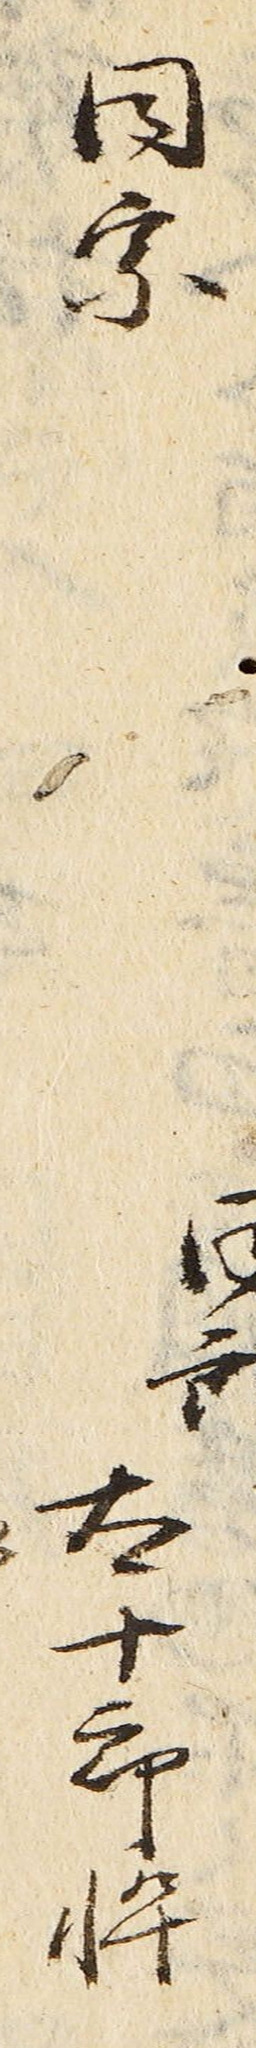同宗太十郎悴
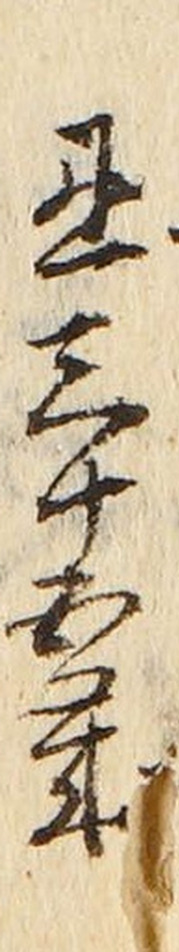丑三十五歳
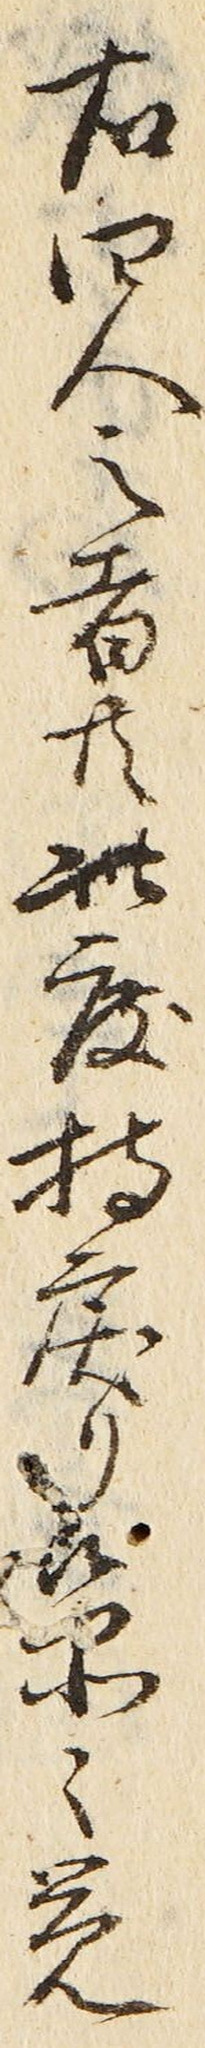右四人之者共此度持戻り候品々覚
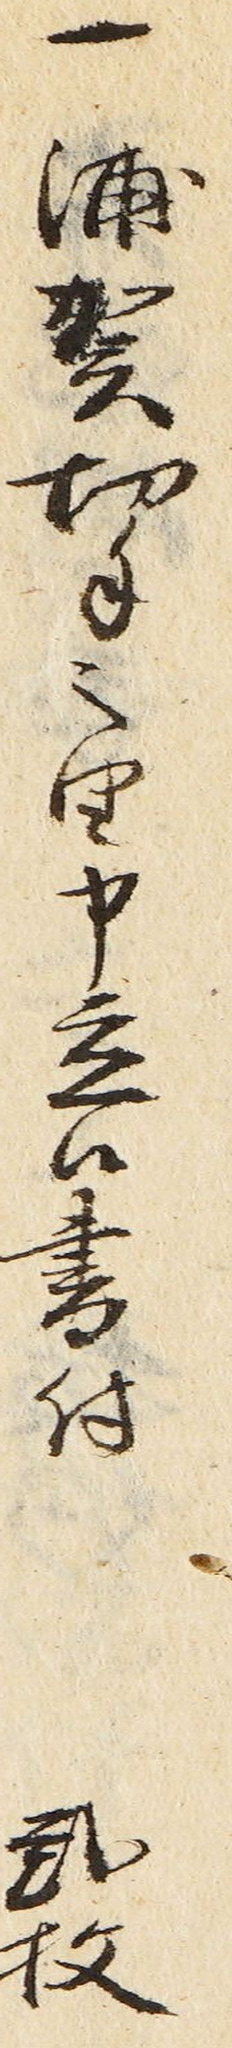一浦賀切手之由申立候書付弐枚
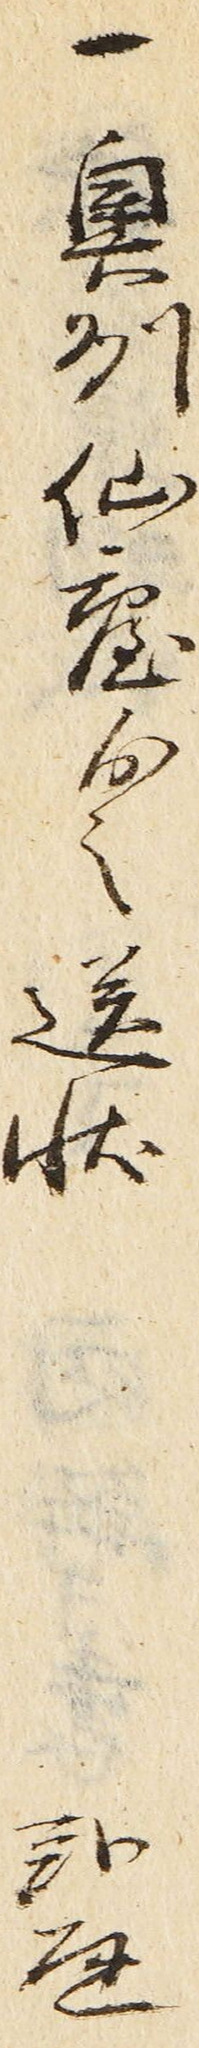一奥州仙台ゟ之送状弐通
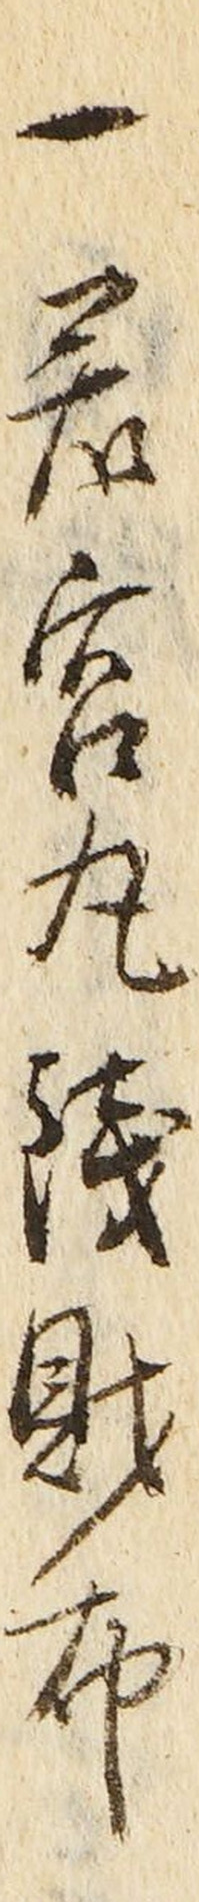一若宮丸銭財布壱
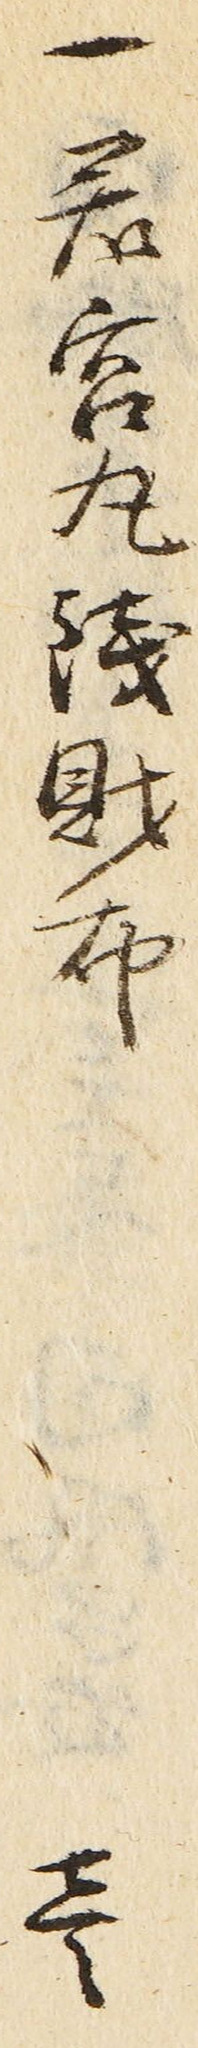一若宮丸銭財布壱
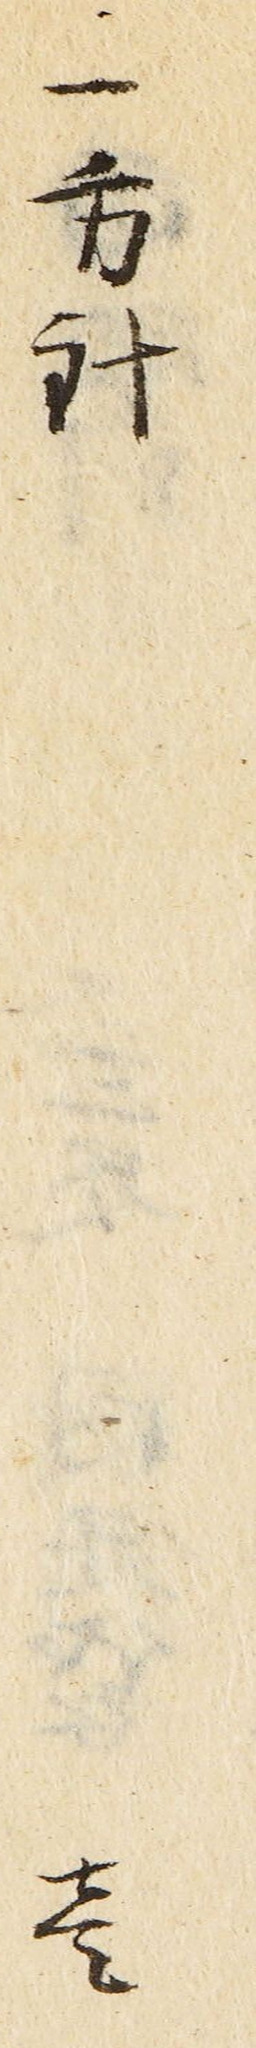一方針壱
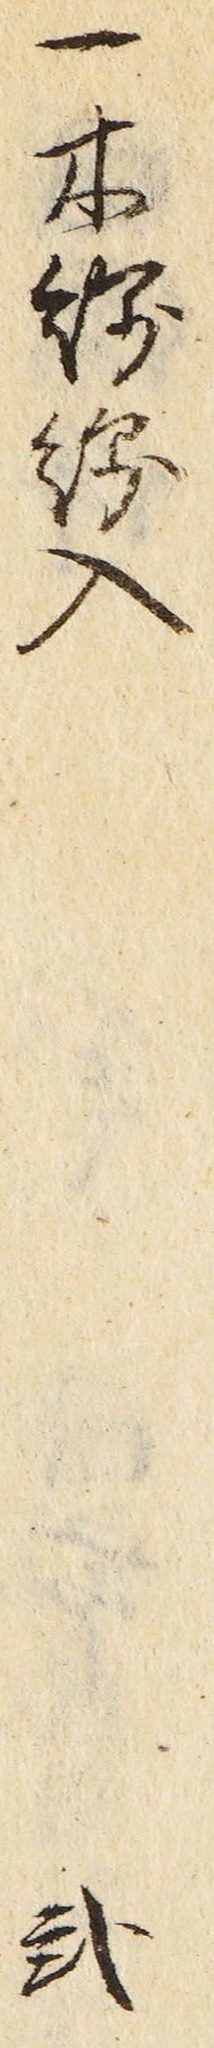一木綿綿入弐
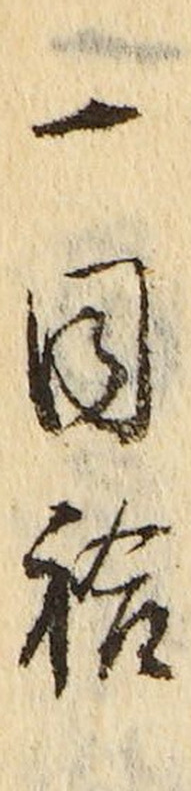一同袷五
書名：漂民後記
